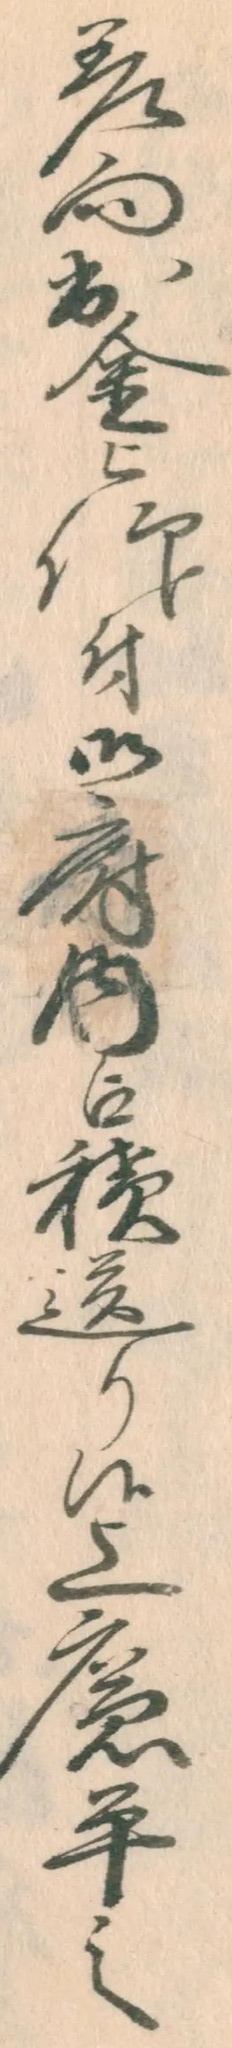差向出金被仰付御府内え積送り候上廉平之
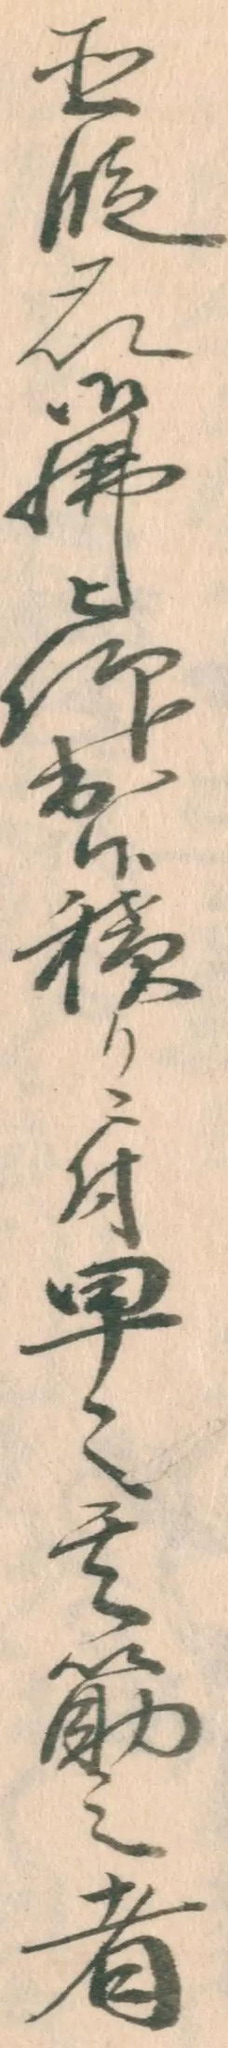直段ヲ以御払被仰出候積りニ付早〻其筋之者
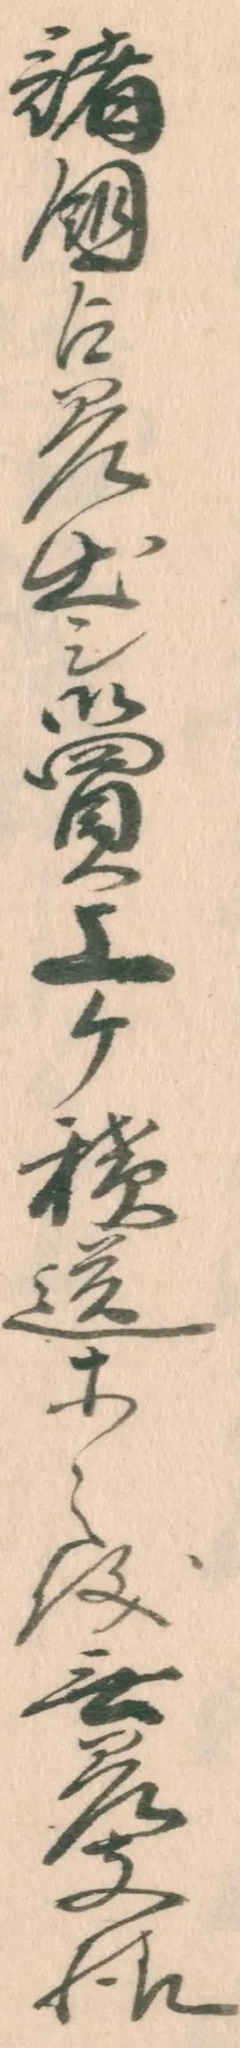諸国え差出シ御買上ケ積送等之儀無差支様
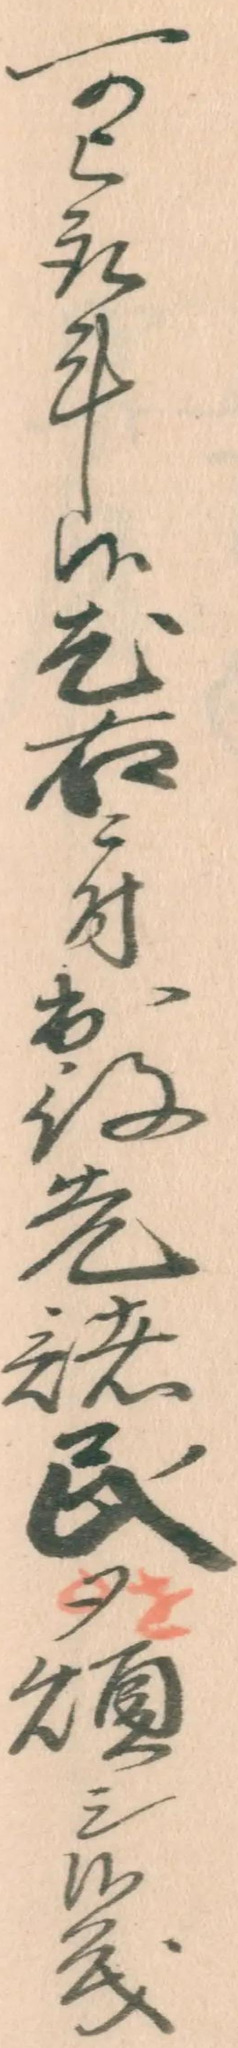可被取計候尤右ニ付出役先諸民を煩シ候義
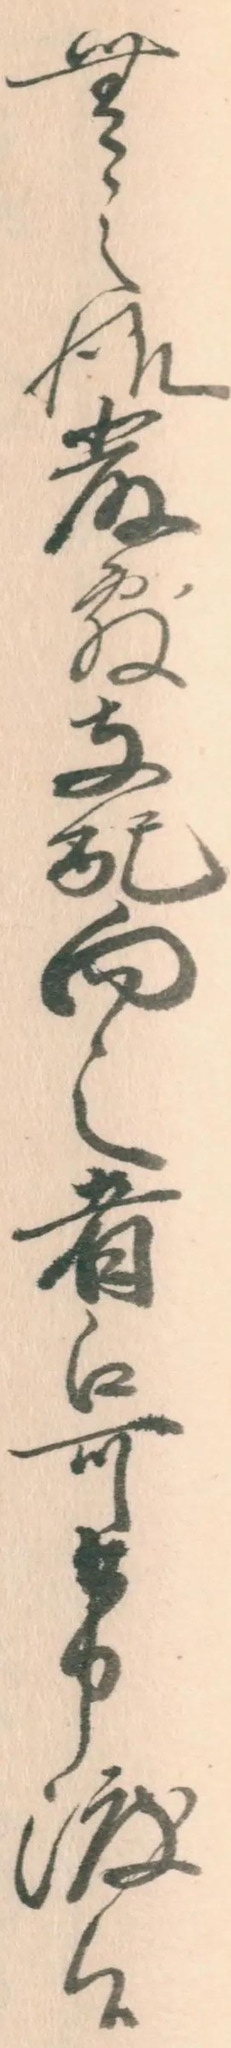無之様厳敷支配向之者え可被申渡候

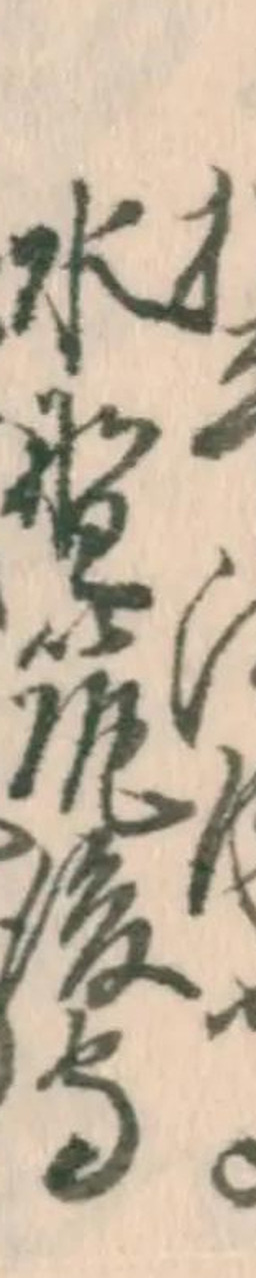│水野筑後守
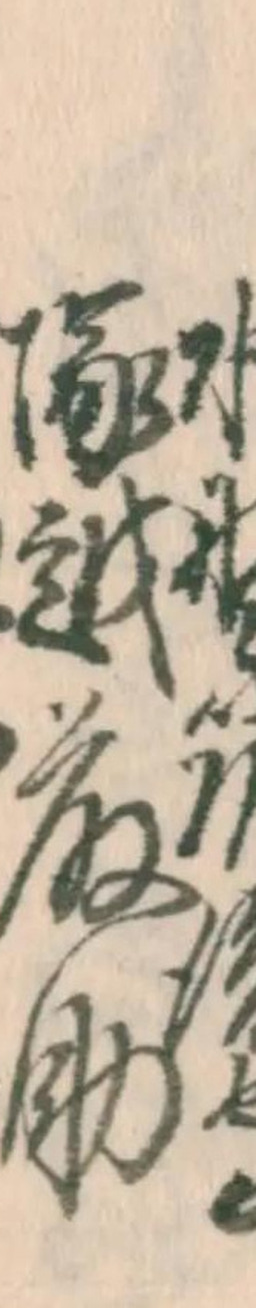│塚越藤助
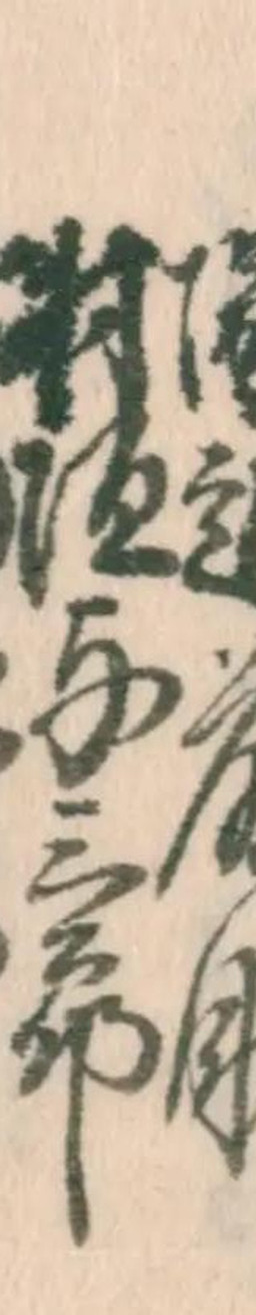│村垣与三郎
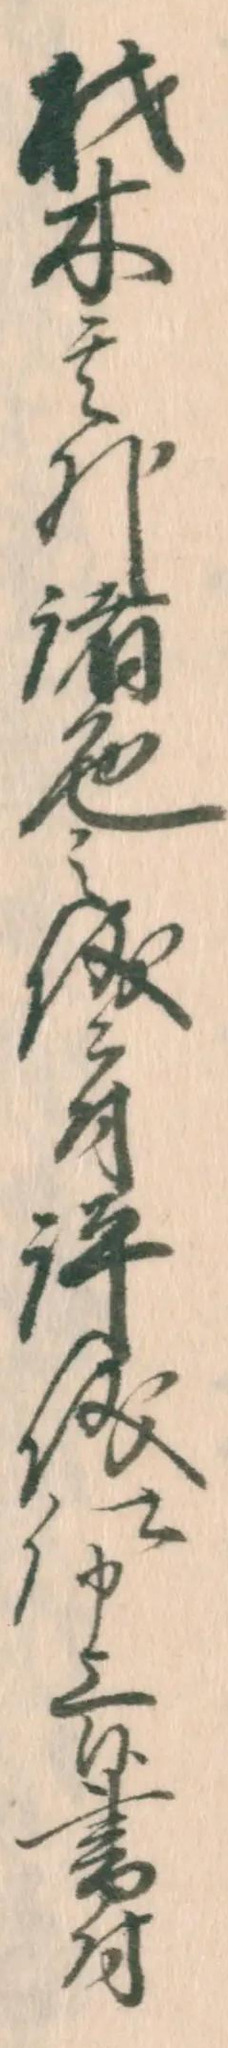│材木其外諸色之儀ニ付評議仕申上候書付
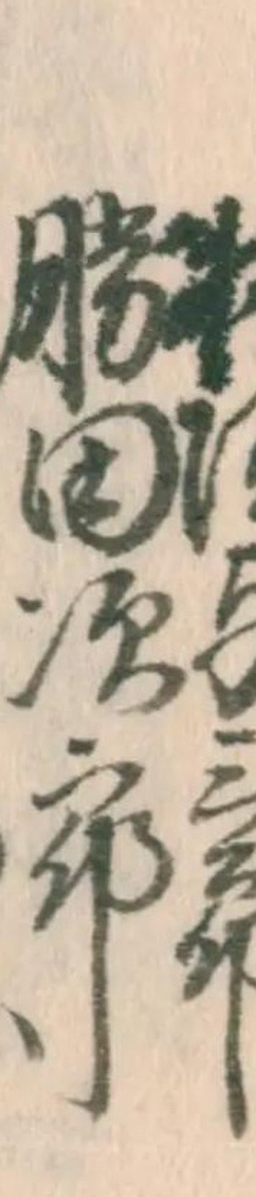│勝田次郎
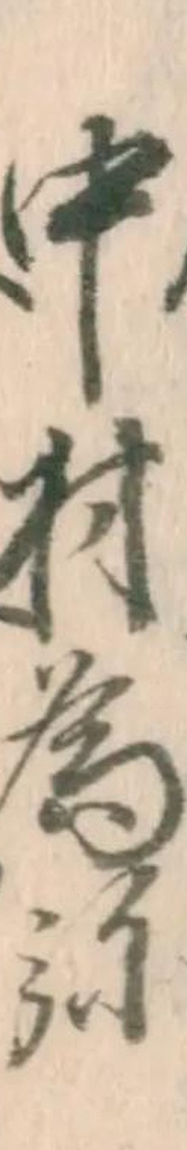│中村為弥
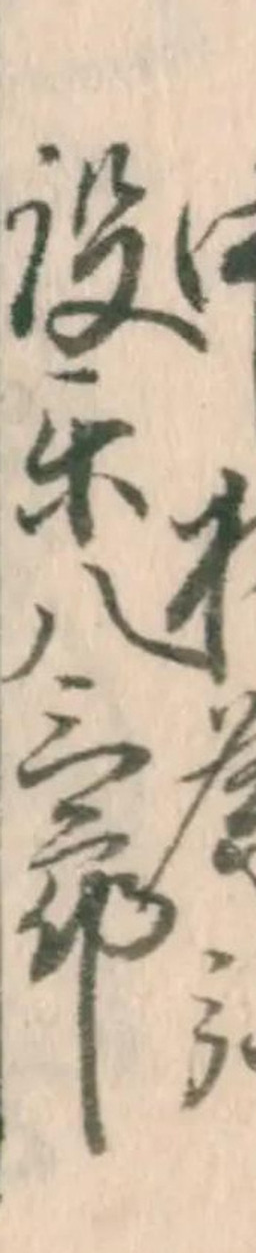│設楽八三郎
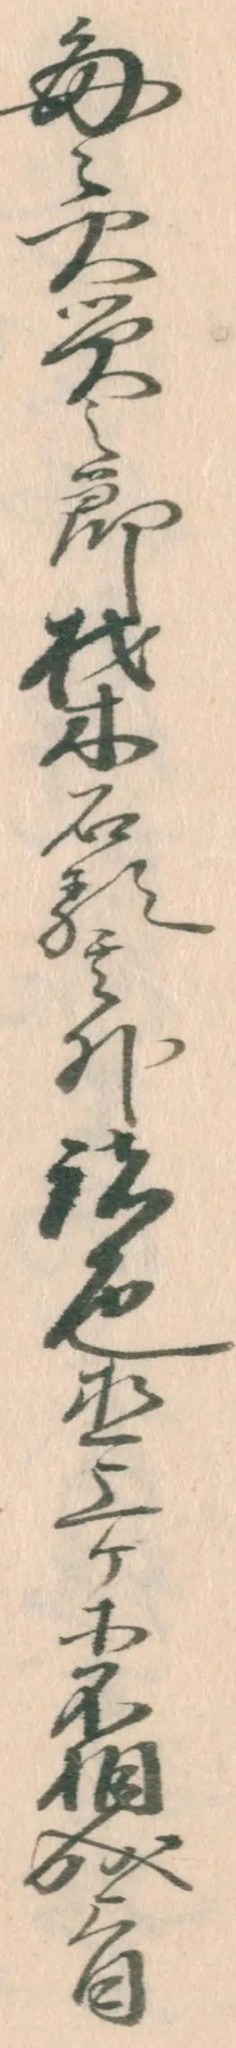毎〻火災之節材木石類其外諸色直上ケ等不相成旨
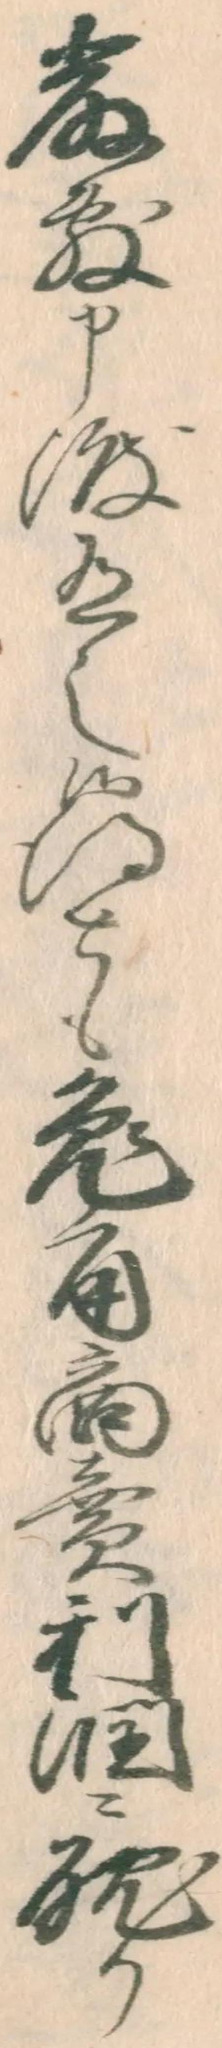厳敷申渡有之候得とも兎角商売利潤ニ耽り
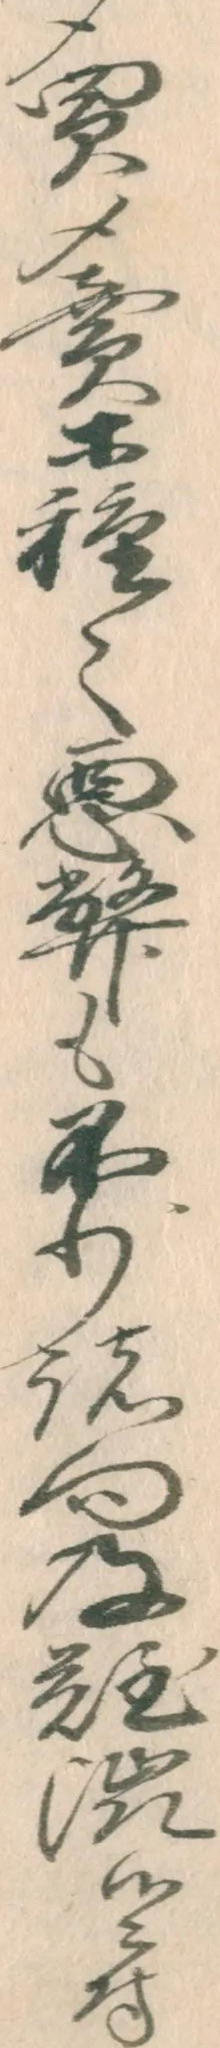〆買〆売等種〻悪弊も不少諸向及難渋候ニ付

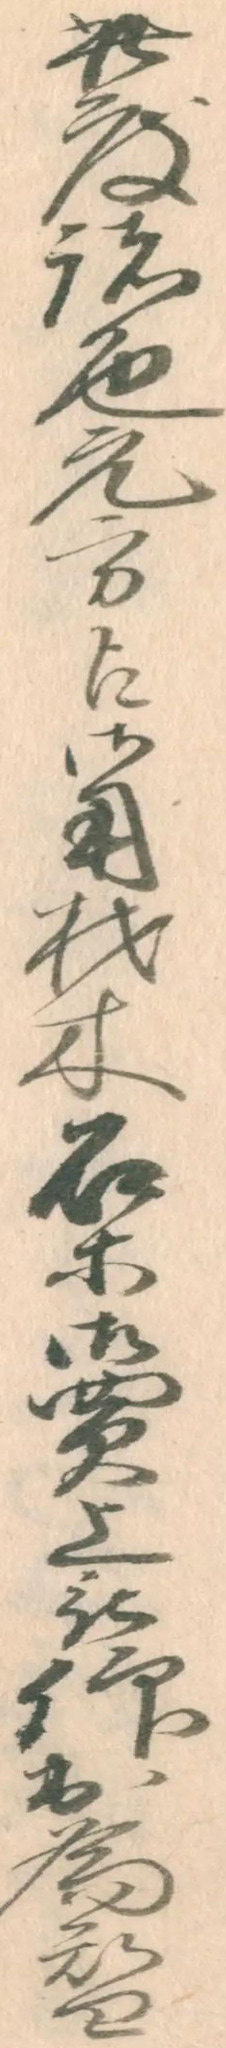此度諸色元方え御用材木石等御買上ケ被仰出為替
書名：地震災書留 2巻. [2] 内表紙に「地震一件　安政二卯年十月」とあり
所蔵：国立国会図書館 National Diet Library, JAPAN
